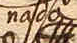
nada
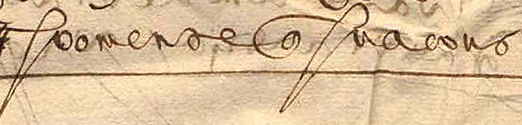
soomente q̄ sua cons
